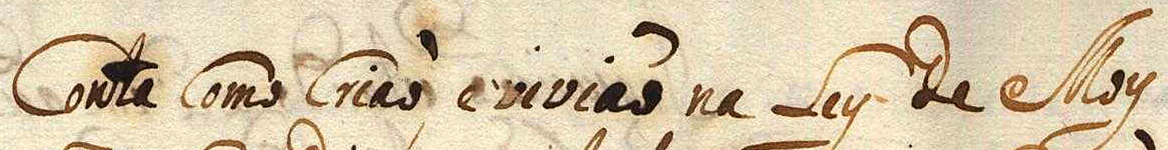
Conta Como Criaõ, e viviaõ na Ley de Moy
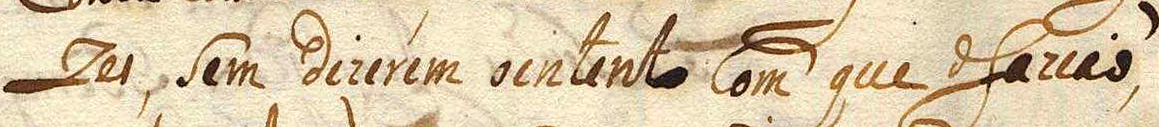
zes, sem dizerem o intento Com que o faziaõ,
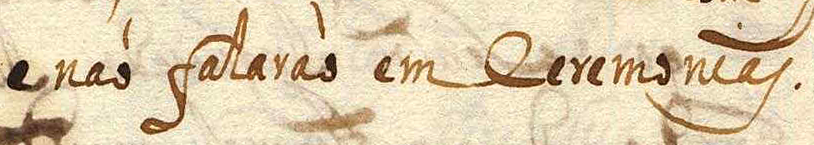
e naõ falaraõ em Ceremonias.
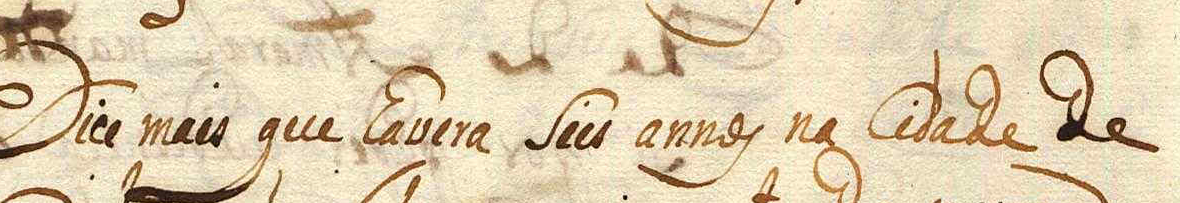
Dice mais que hauera seis annos na Cidade de
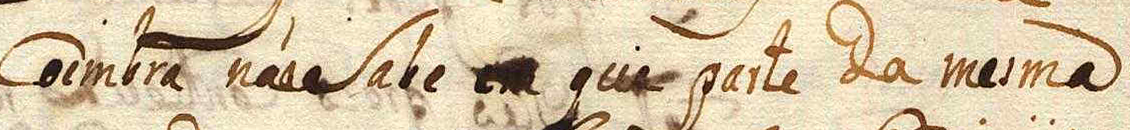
Coimbra naõ Sabe em que parte da mesma
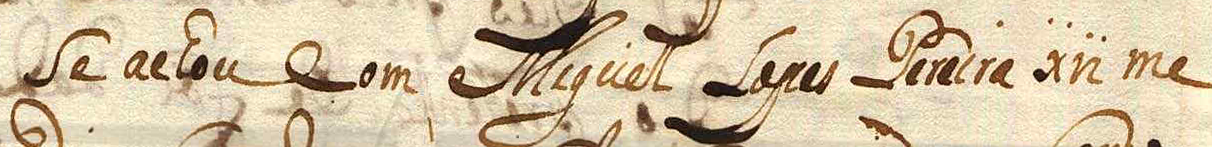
Se achou Com Miguel Lopes Pereira x̄ n̄ me
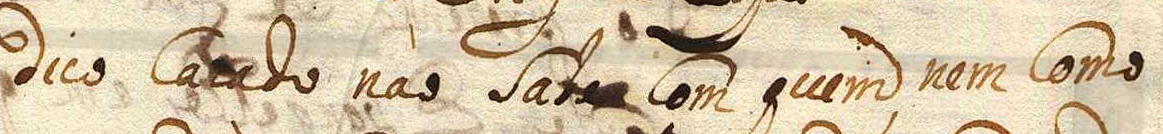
dico Cazado naõ Sabia com quem, nem Como
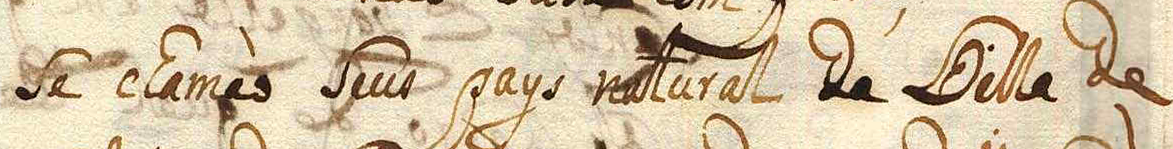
se chamão Seus pays natural da Villa de
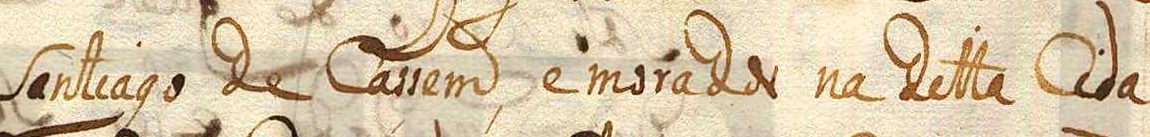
Santiago de Cassem, e morador na ditta Cida
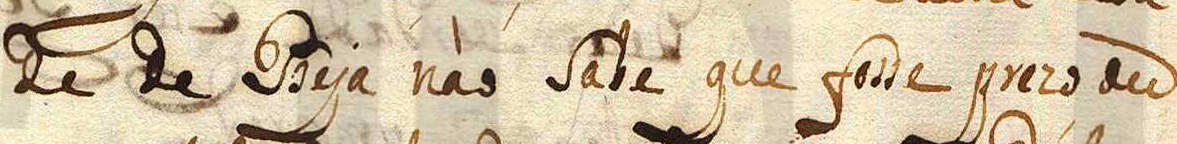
de de Beja não sabe que fosse prezo ou
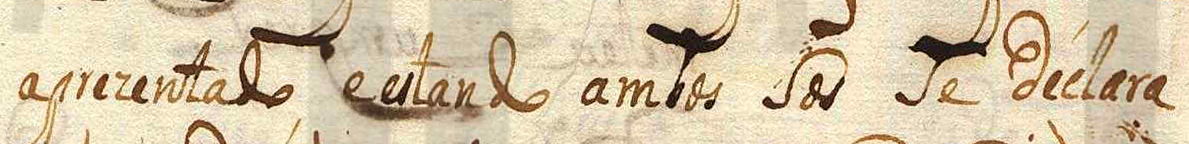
aprezentado, e estando ambos sos se declara
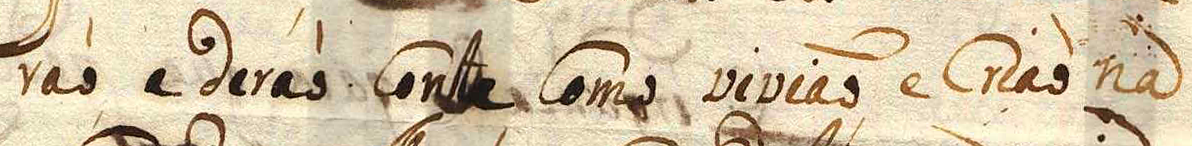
raõ, e derão Conta Como viviaõ, e Criaõ na
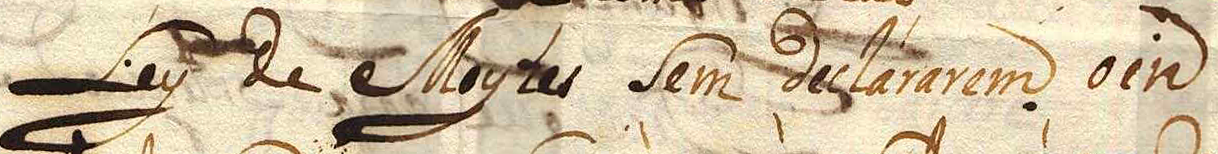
Ley de Moyzes sem declararem, o in
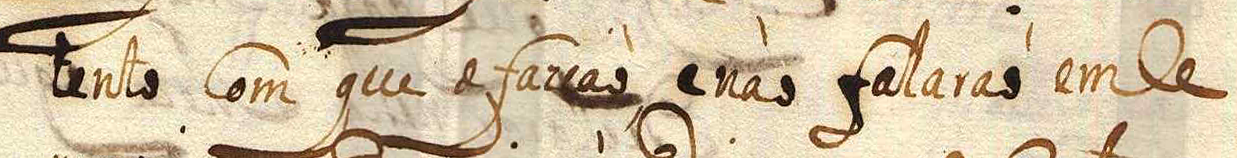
tento Com que o faziaõ e não falaraõ em Ce
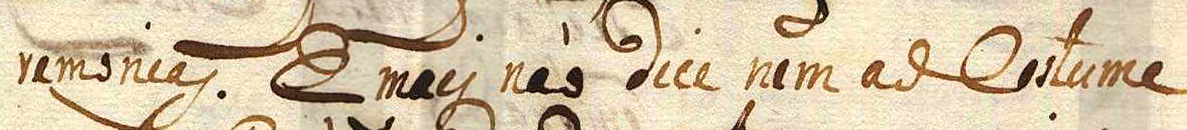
remonias. E mais não dice nem ao Costume
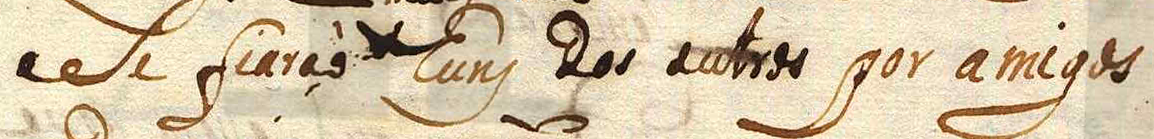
e Se fiaraõ huns dos outros por amigos
